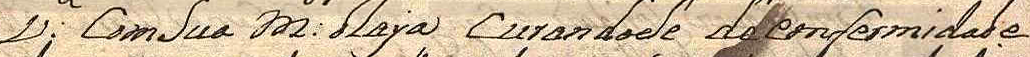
v.a com sua m:er oLaya, curandose da emfermidade
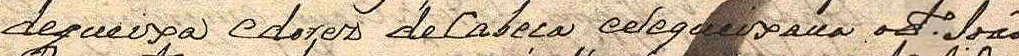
de queixa e dorez de cabeça e se queixava o dt.o Ioão
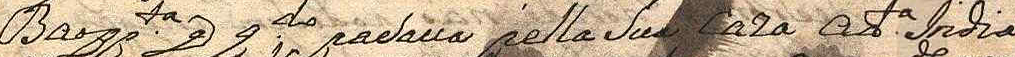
Baopp.ta q̄ q.d pasava pella sua caza a dt.a India
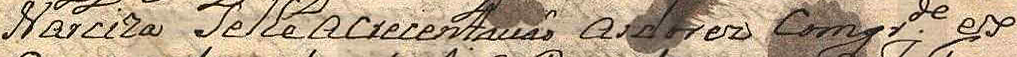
Narciza se lhe acrescentauaõ as dorez com gr.de ex
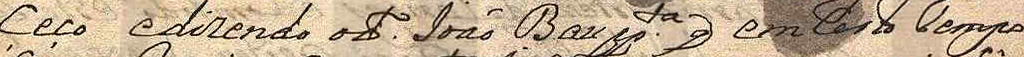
çeço e dizendo o dt.o Ioão Baupp.ta q̄ em certo Tempo
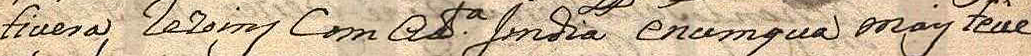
tivera Rezoins Com a dt.a Jndia e numqua mais têve
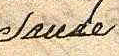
saude
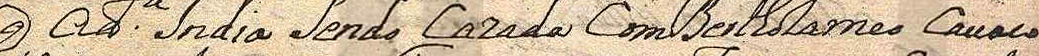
q̄ a dt.a India sendo Cazada Com BerthoLameo Cavaco
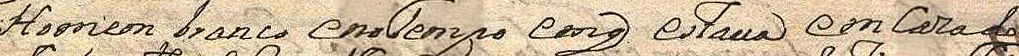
Homem branco e no Tempo em q̄ estava em caza do
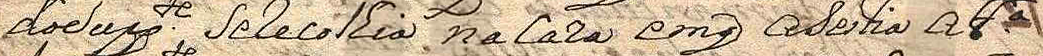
do supp.te se Recolhia na caza em q̄ aSestia a F.a
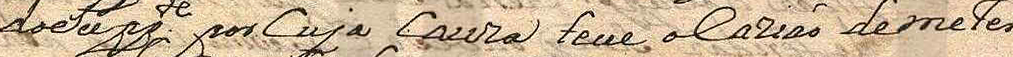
do Supp.te por Cuja cauza teve oCaziaõ de meter
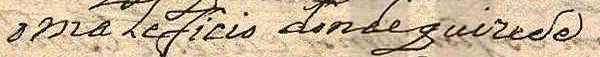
o maleficio donde quizese
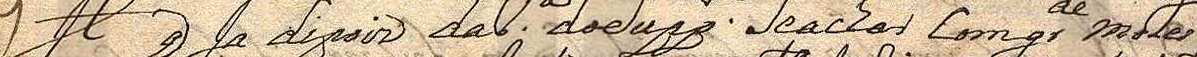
9 item q̄ Ja depoiz da F.a do supp.te se achar com gr.de moles
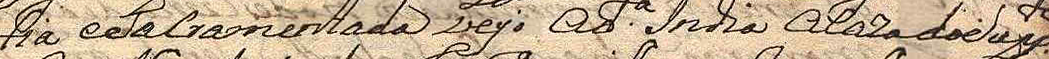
tia e sacramentada veyo a dt.a India a caza do supp.te
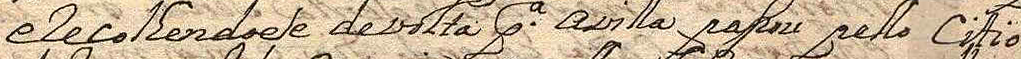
e Recolhendose de volta p.a a villa passou pello cittio
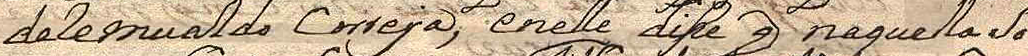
de Remualdo Correya, e nelle disse q̄ naquella so
